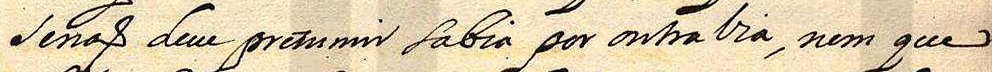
se naõ deue presumir sabia por outra via, nem que
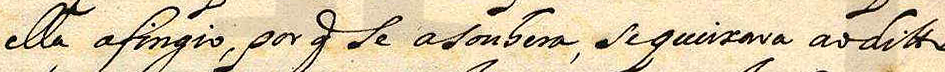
ella a fingio, porq̄ se a soubera, se queixaua ao ditto
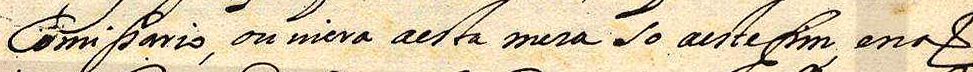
Comissario, ou uiera a esta meza so a este fim, e naõ
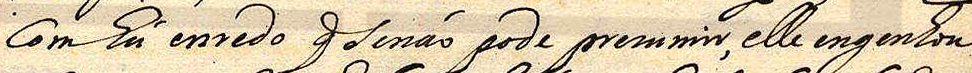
Com hū enredo q̄ se naõ pode presumir, elle engenhou
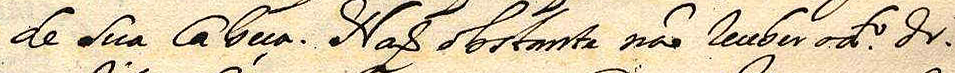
de sua Cabeça. Naõ obstante não Receber o d̄.o dr.o
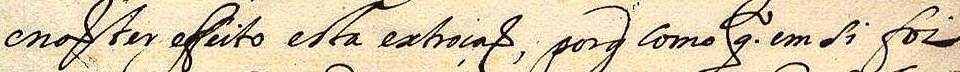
e naõ ter effeito esta extroçaõ, porq̄ como q.to em si foi
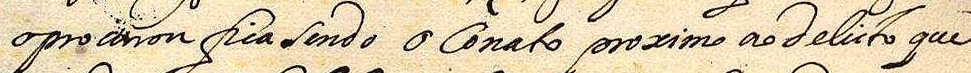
o procurou fica sendo o Conato proximo ao delicto que
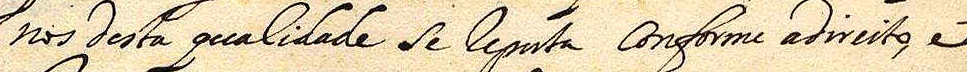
nos desta qualidade se Reputa Conforme a direito, e
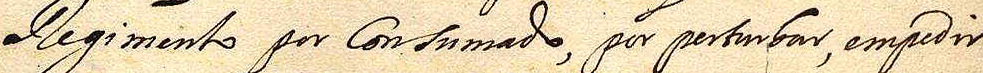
Regimento por Consumado, por perturbar, empedir
